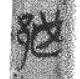𫑛（越）
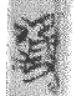涌
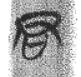君
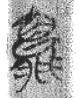𬢙
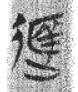𬨭（將）
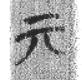亓
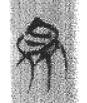眾
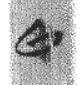㠯
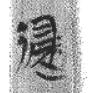䢜（歸）
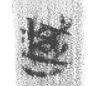楚
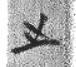之
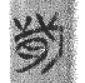歲（歲）
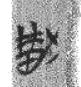𬏄（荊）
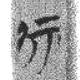𫵖
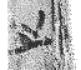之
